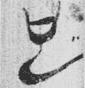也
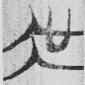吳
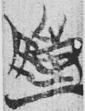○（陳）
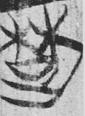楚
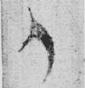人
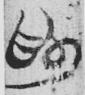爲
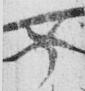不
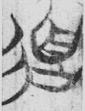道
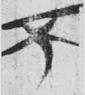不
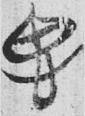思
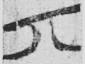亓（其）
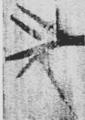先
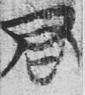君
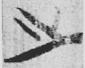之
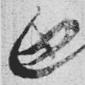臣
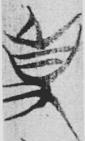事
